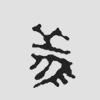羕
